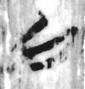㠯
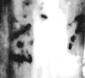㠯（以）
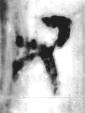又（有）
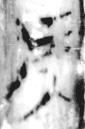疾
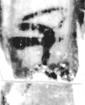子
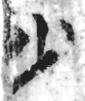少
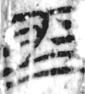翏（瘳）
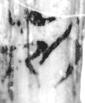死
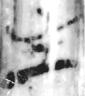生
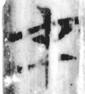才（在）
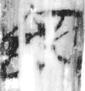寅
